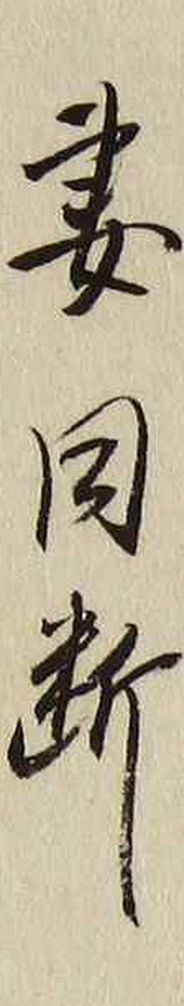妻同断
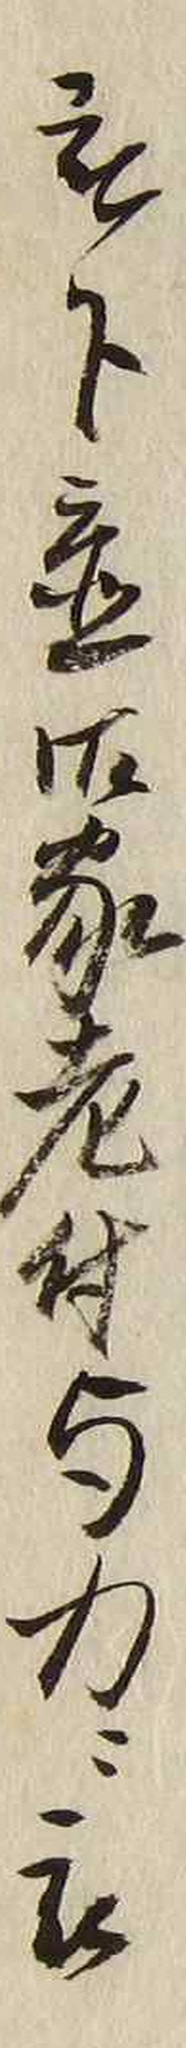被下置御家老付与力被

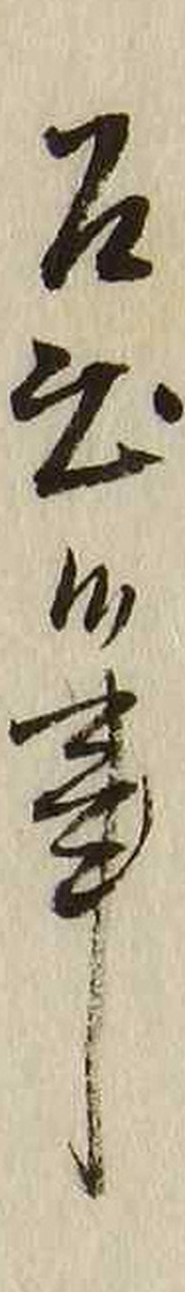召出候事
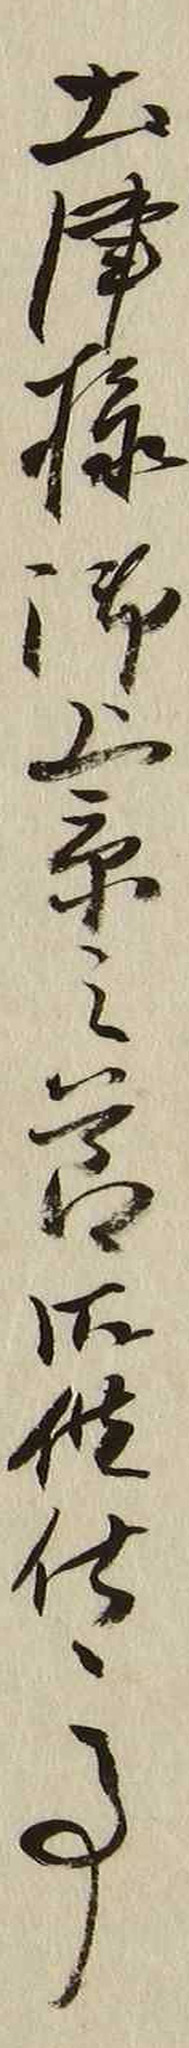土津様御上京之節御供仕候事
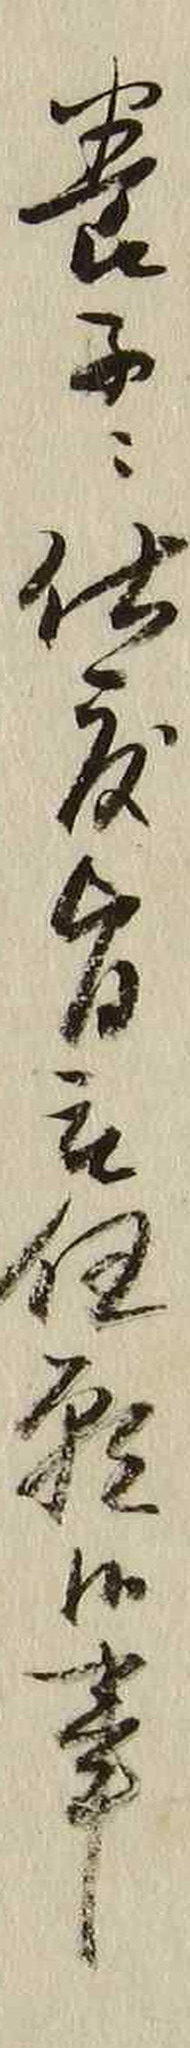養子仕度旨被任願候事
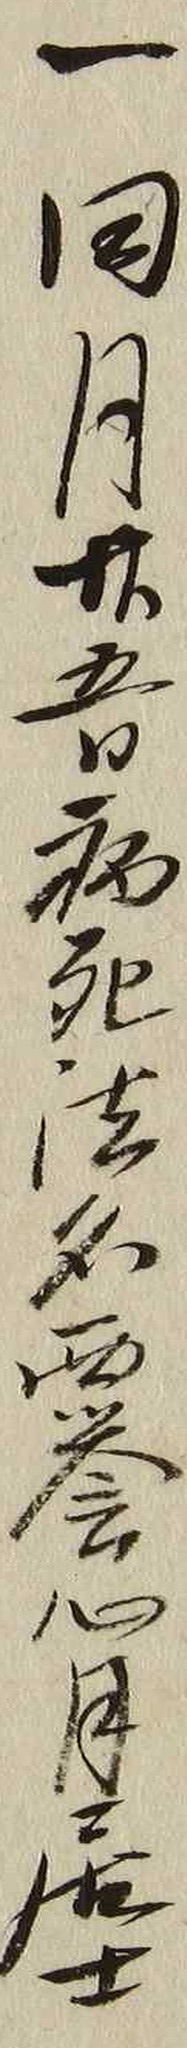一同月廿五日病死法名西誉心月居士
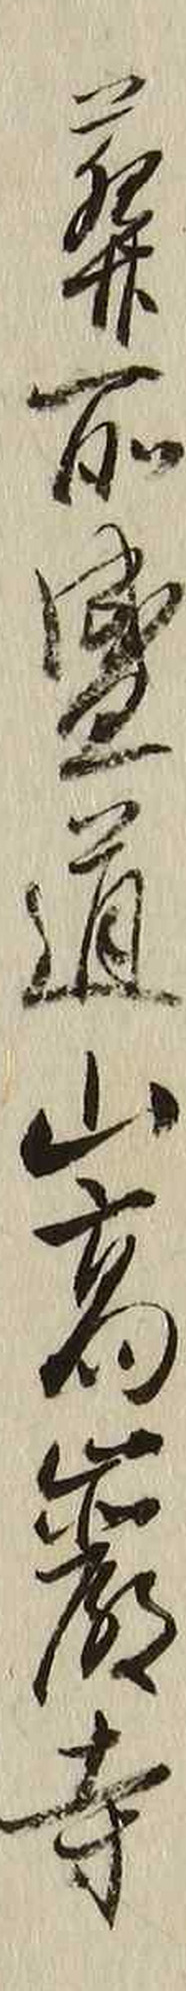葬所盛道山高巖寺
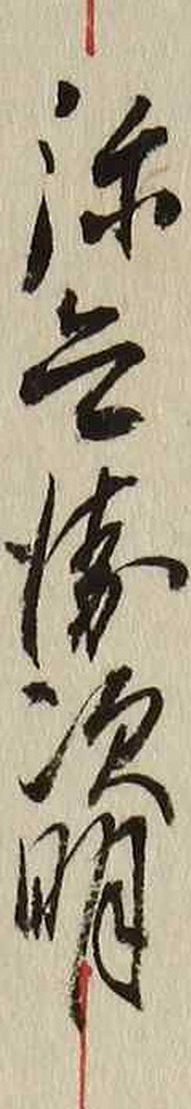弥兵衛次明
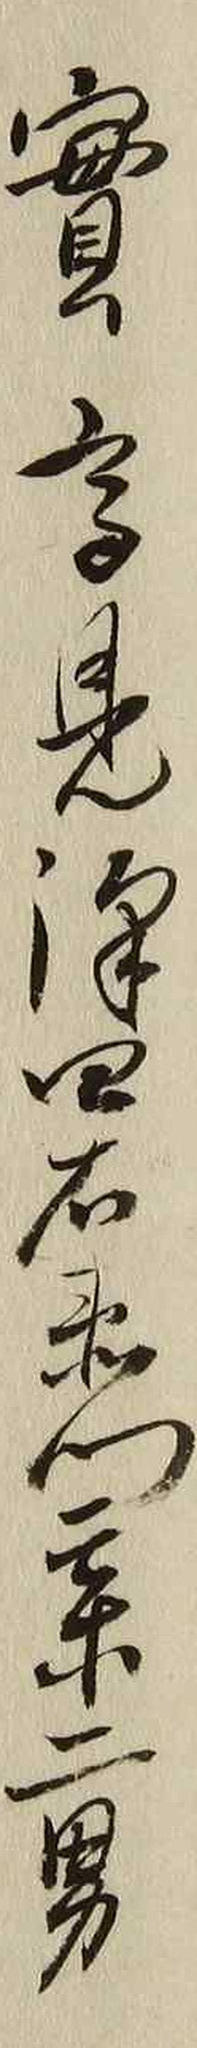実高見沢四右衛門某二男
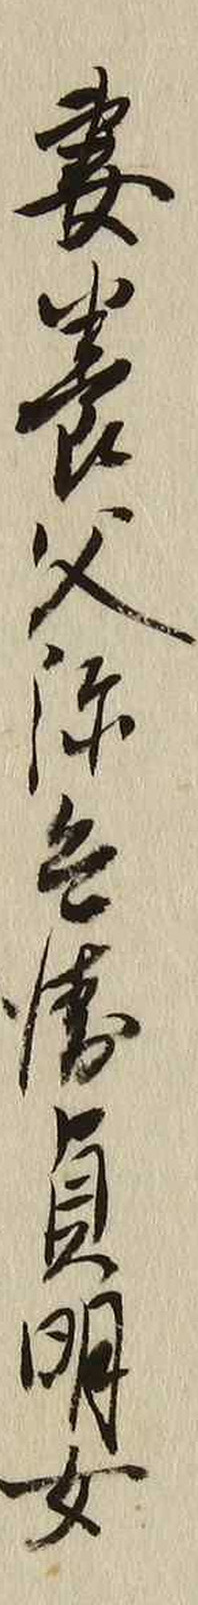妻養父弥兵衛貞明女
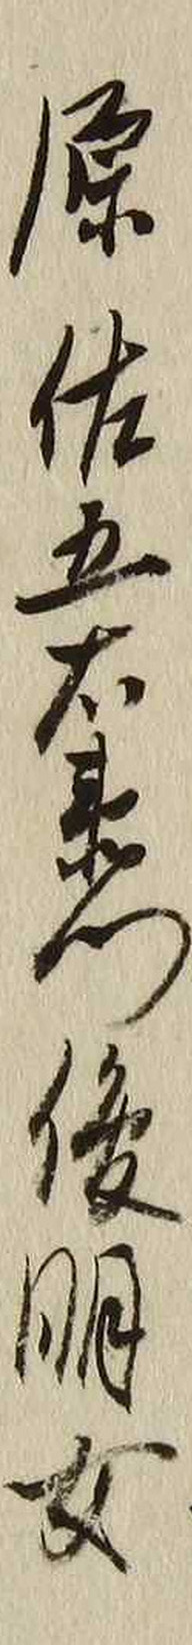原佐五右衛門俊明女
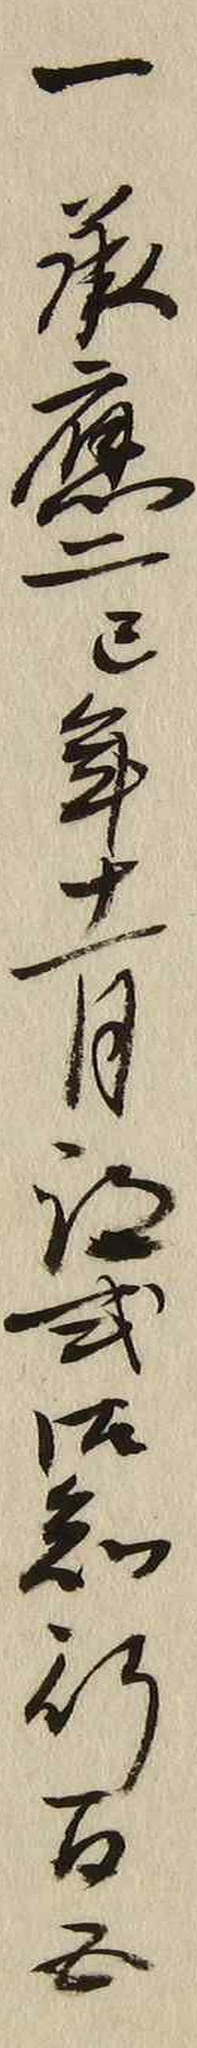一承応二巳年十一月跡式御知行百五
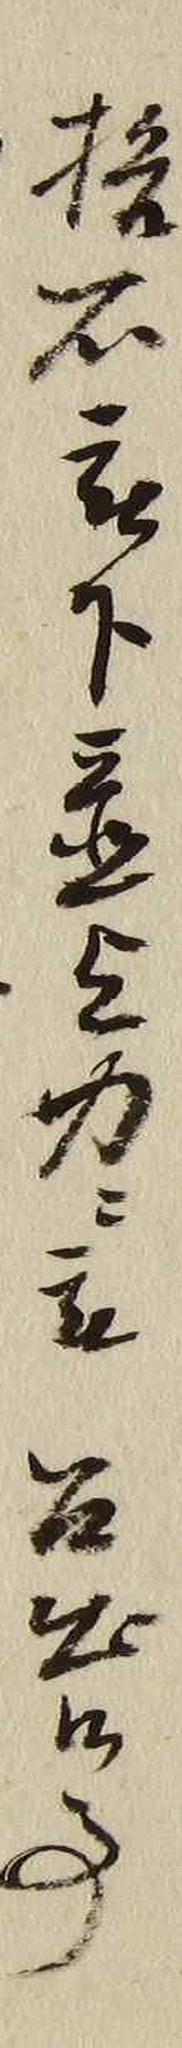拾石被下置与力被召出候事
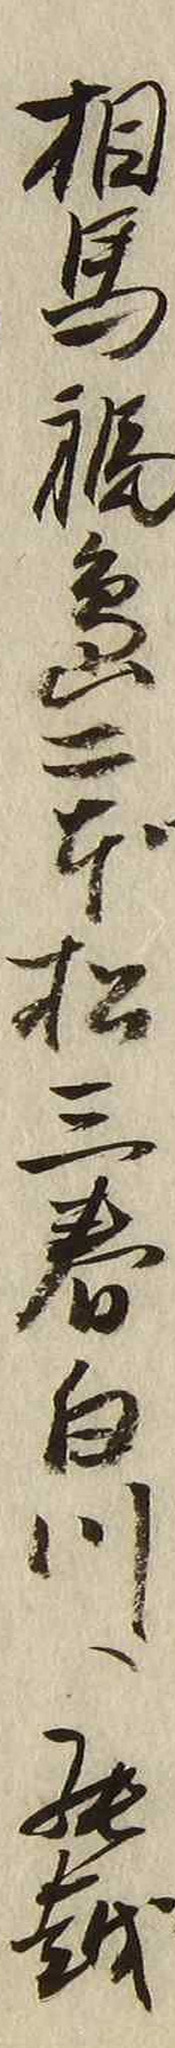相馬福島二本松三春白川罷越
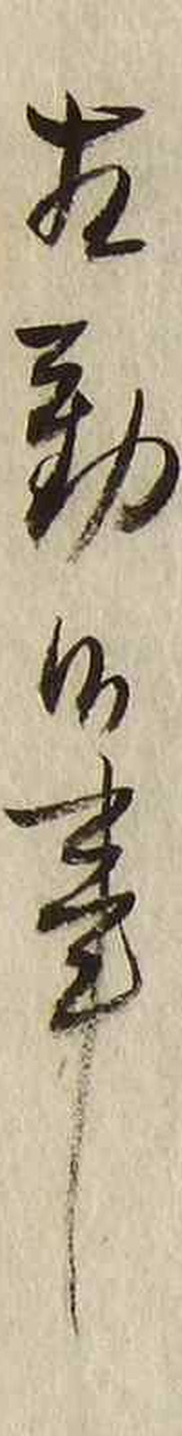相勤候事

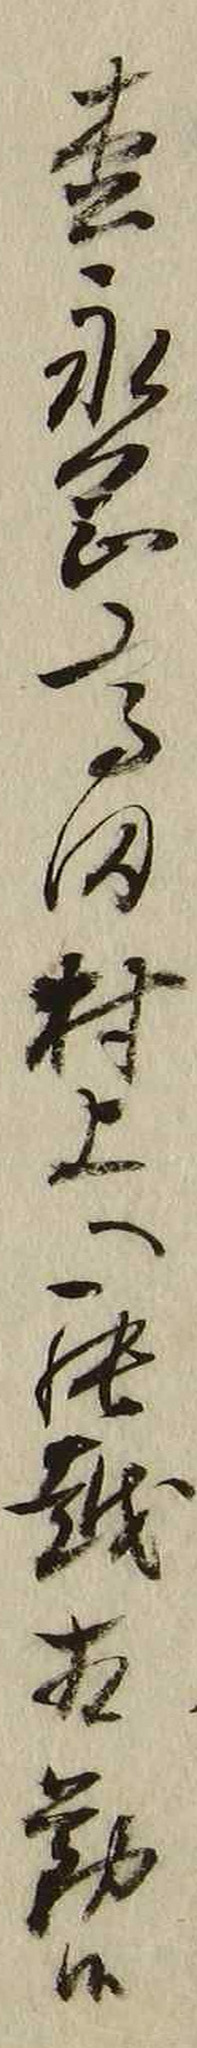松永岡高田村上罷越相勤候
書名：諸士系譜　巻之350　せ之部1冊全
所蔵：会津若松市立会津図書館
